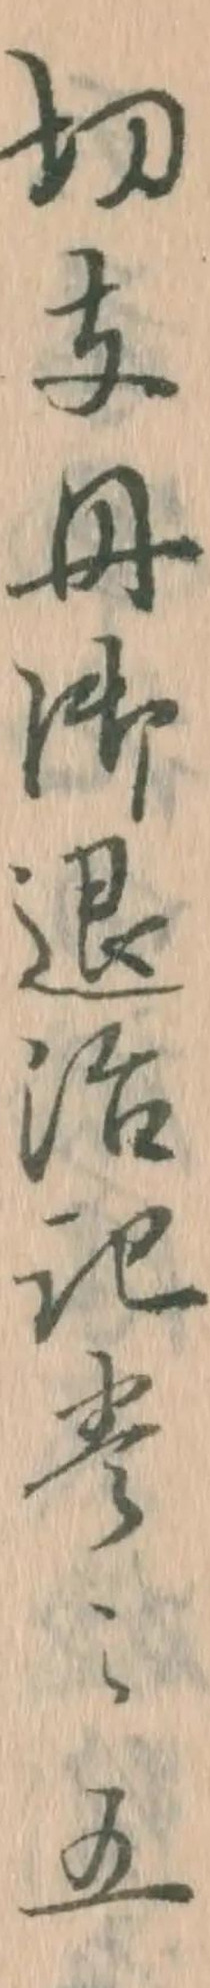切支丹御退治記巻之五
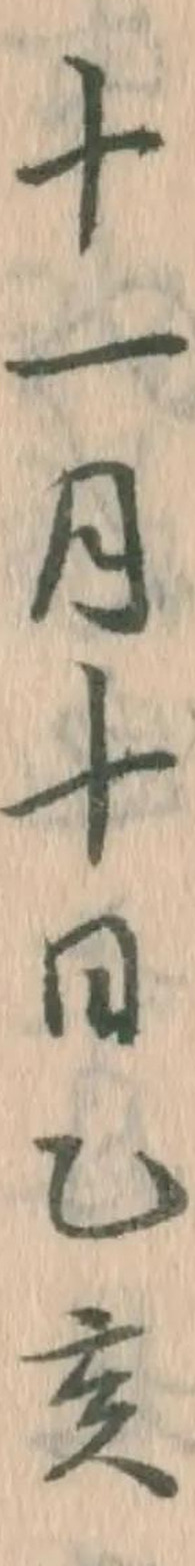十一月十日乙亥
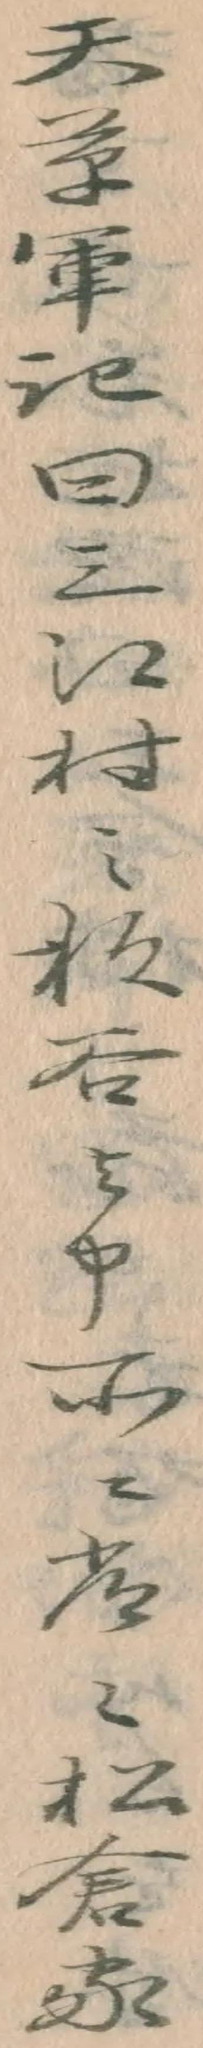天草軍記曰三江村之杉谷与申所に常々松倉家
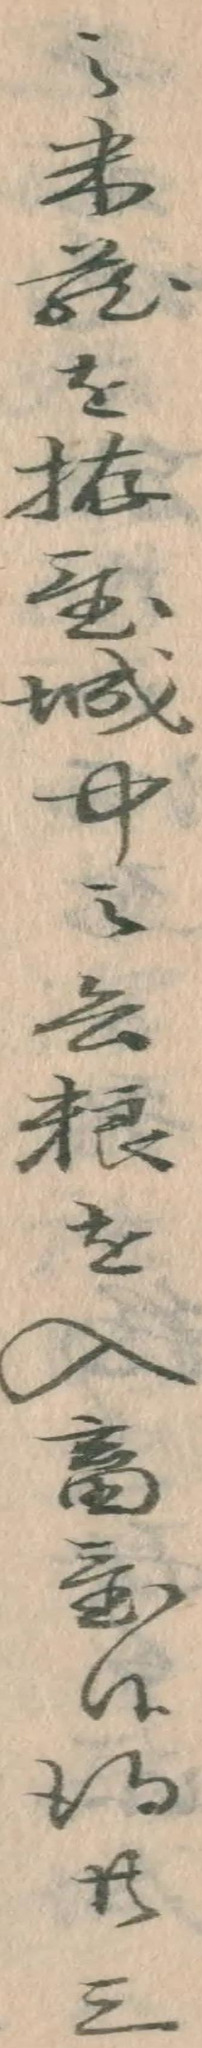之米蔵を拵置城中之兵粮を入畜置候得共三
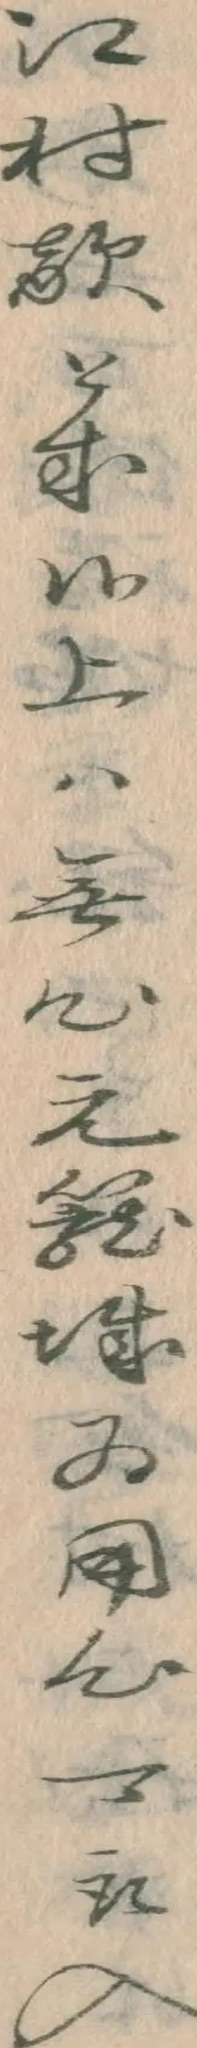江村敵と成候上は無心元籠城ゐ用心可取入
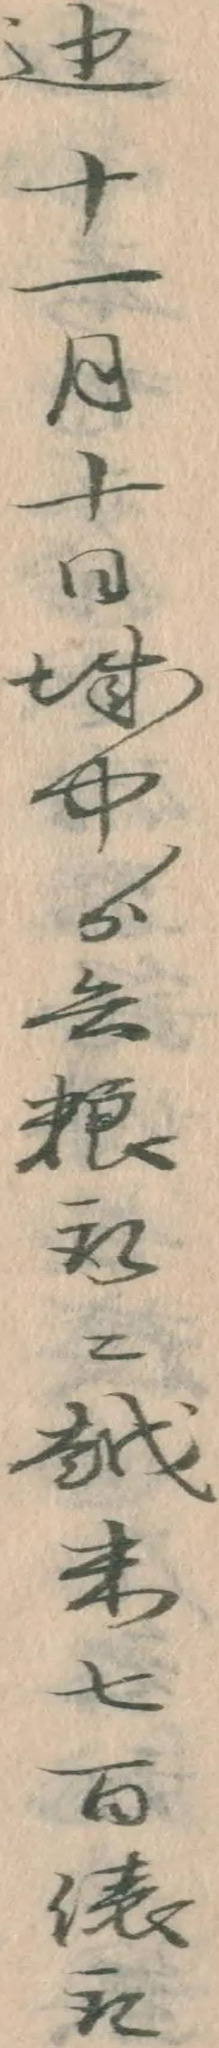迚十一月十日城中ゟ兵粮取に越米七百俵取
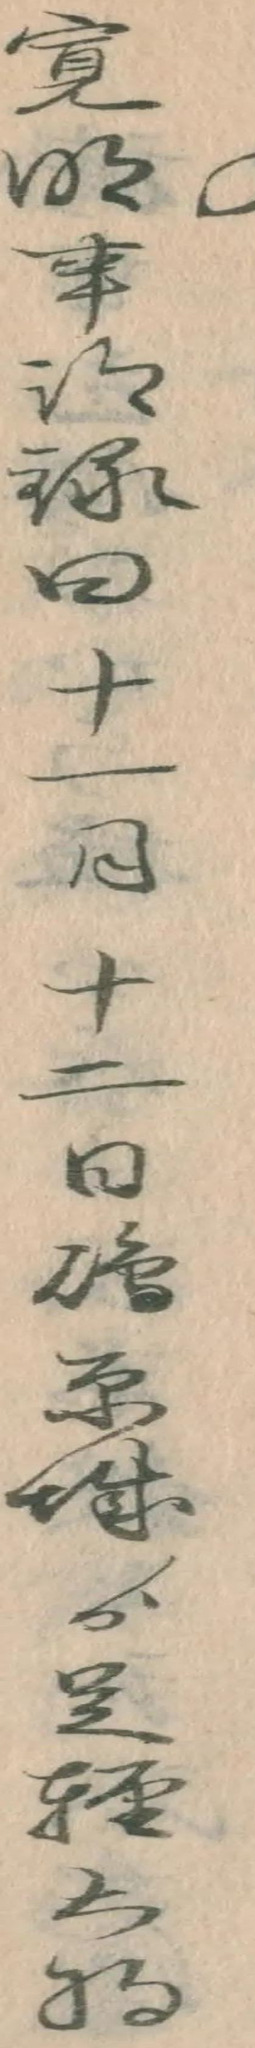寛明事跡録曰十一月十二日島原城ゟ足軽大将
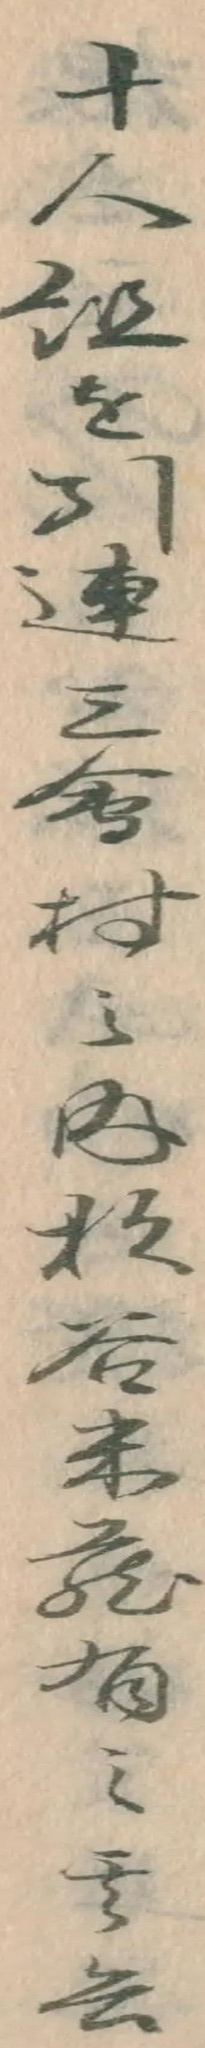十人組を引連三会村之内杉谷米蔵有之其兵

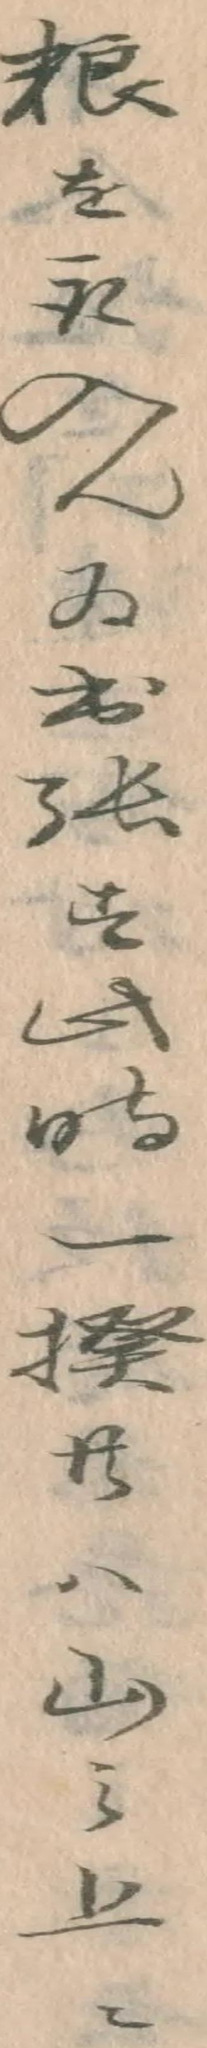粮を取入んゐ出張春此時一揆共は山之上に
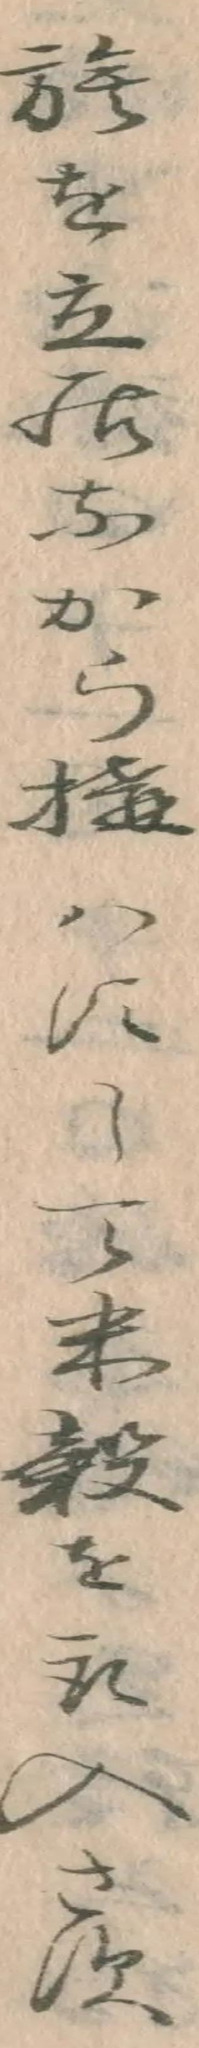旗を立居なから構は須して米穀を取入さ須
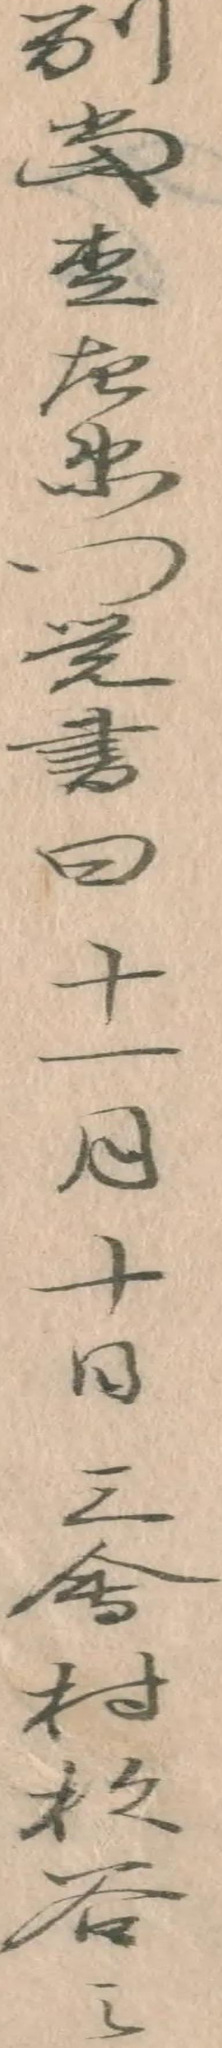別当杢左衛門覚書曰十一月十日三会村杉谷之
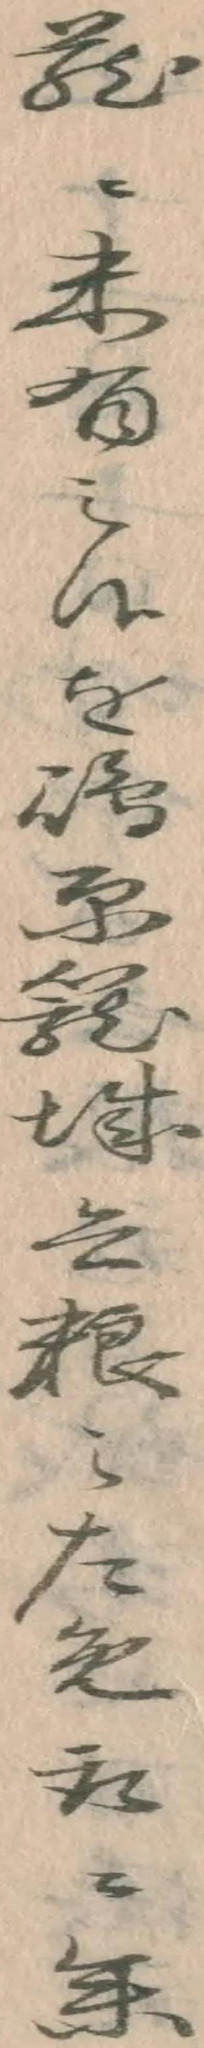蔵に未有之候を島原籠城兵粮之た免取に参
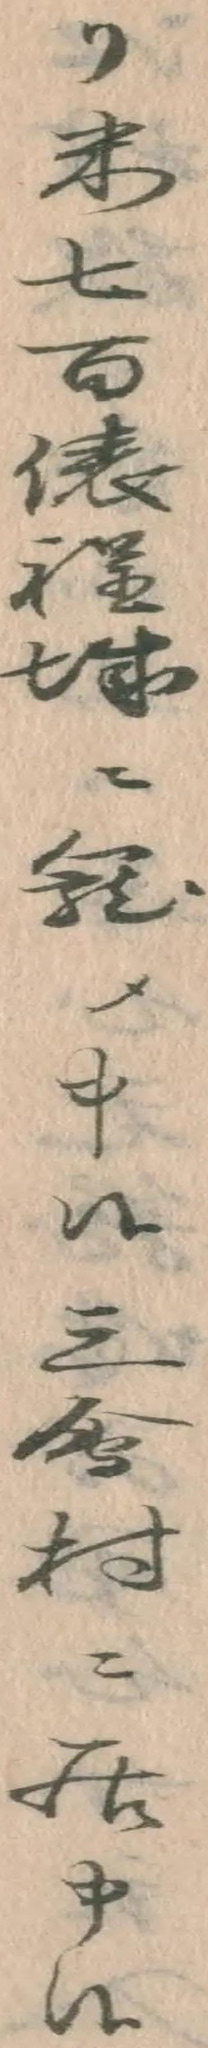り米七百俵程城に籠め申候三会村に居申候
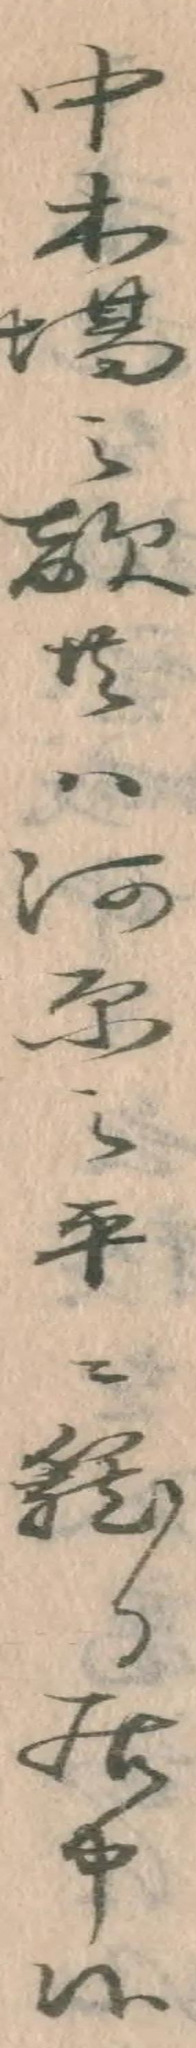中木場之敵共は河原之平に籠り居申候
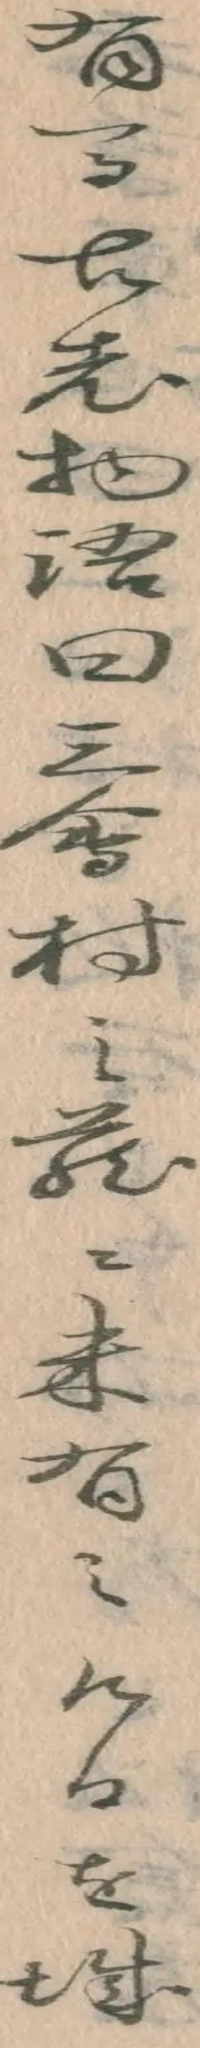有馬古老物語曰三会村之蔵に未有之けるを城
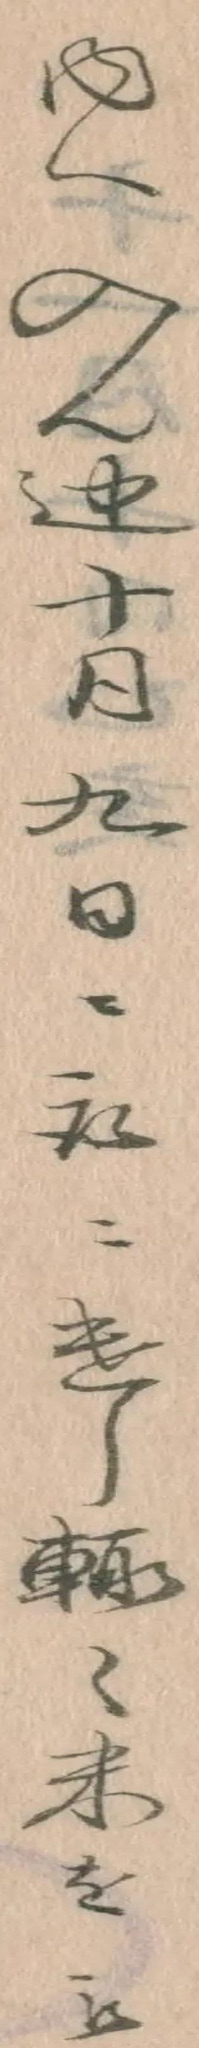内へ入ん迚十月九日に取に遣し輙く米を被
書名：切支丹御退治記 49巻. [2]
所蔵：国立国会図書館 National Diet Library, JAPAN
